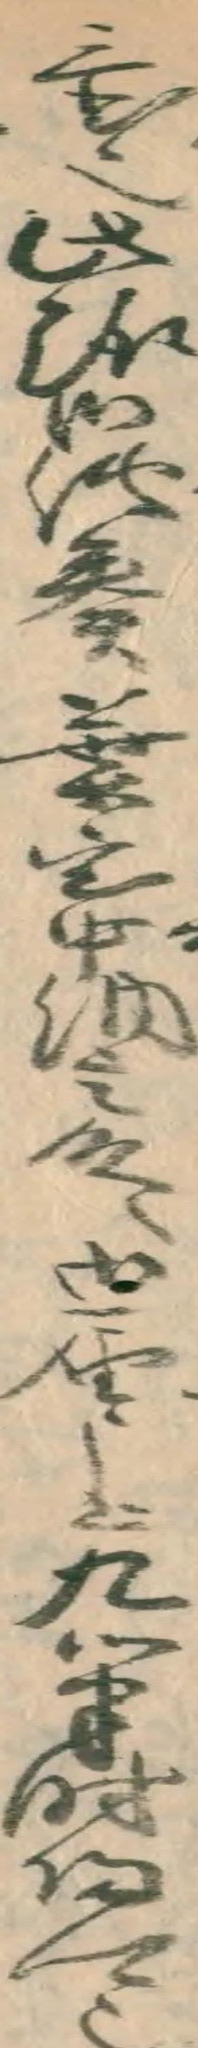置也此趣御伝奏葉室中納言殿へ御届申上九ツ半時帰郷也
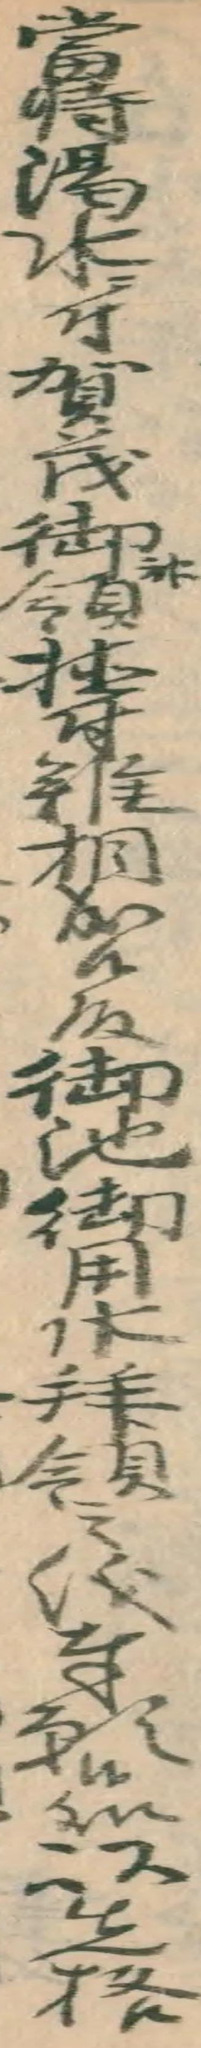当時渇水ニ付賀茂御神領植付難相成候故御池御用水拝領之儀奉願候処以先格
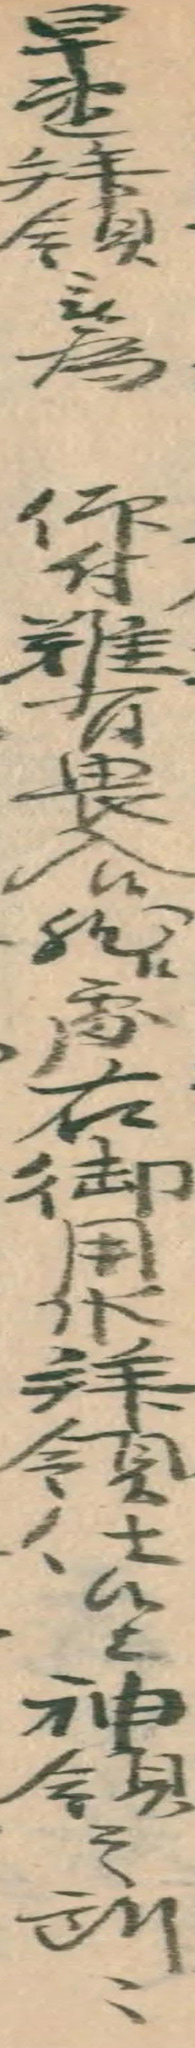早速拝領被為仰付難有畏入候然ル処右御用水拝領仕候上神領之所々
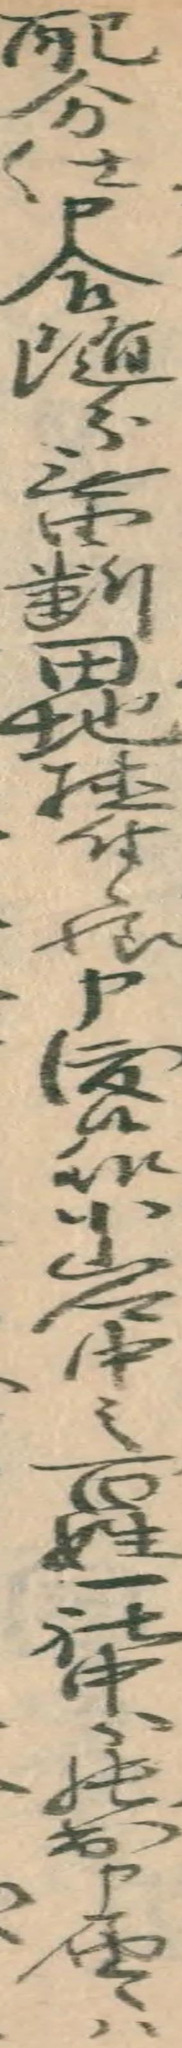配分仕申合随分無由断田地植付候様申渡候処小山郷中之百姓一社中へ罷出申届候ハ
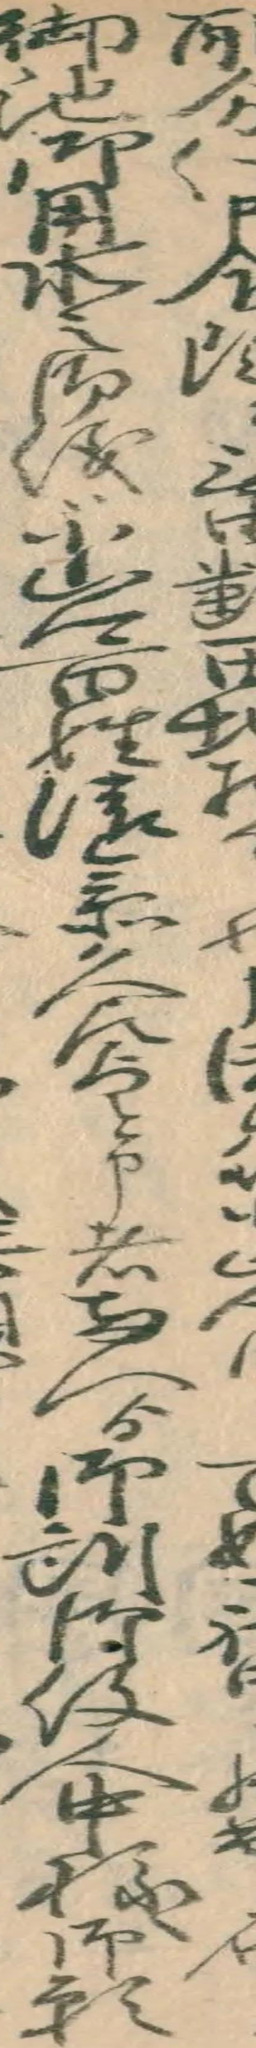御池御用水之御儀小山郷百姓清兵衛久左衛門と申者両人ゟ御所御役人中様へ御願
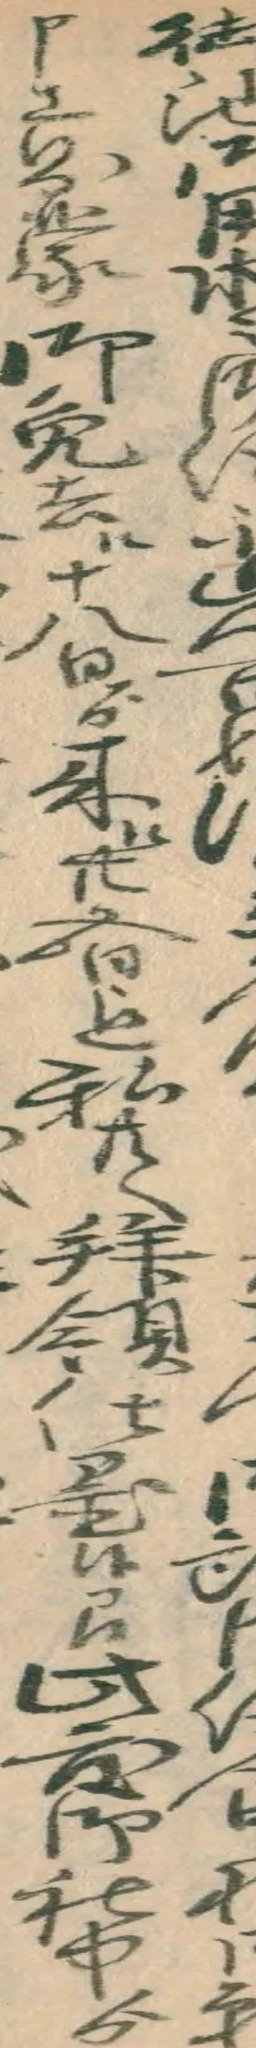申上則蒙御免去ル十八日ゟ来ル廿五日迄私共へ拝領仕置候間此度御社中ゟ
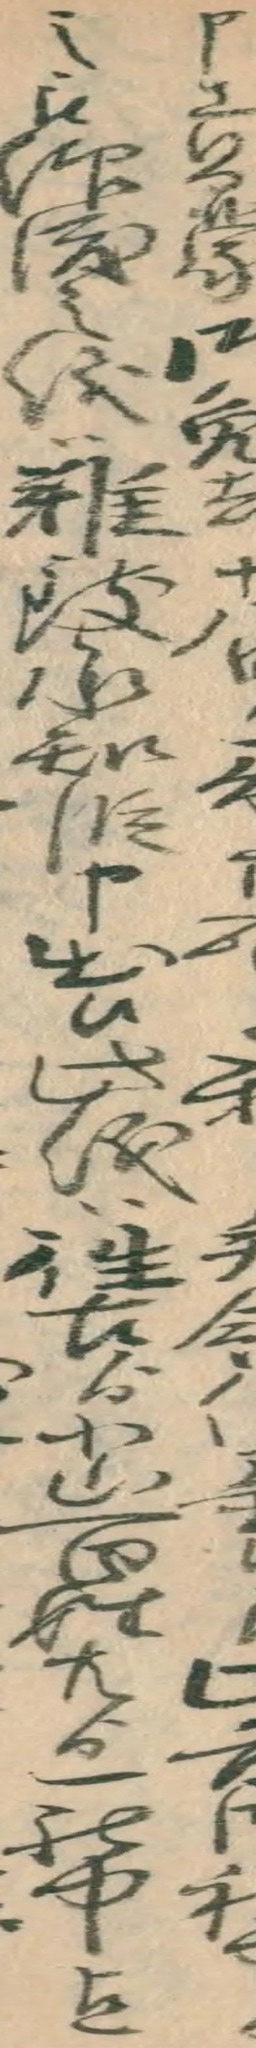之被仰渡之儀ハ難致承知段申出候此儀ハ往古ゟ小山百姓共ゟ一社中迄
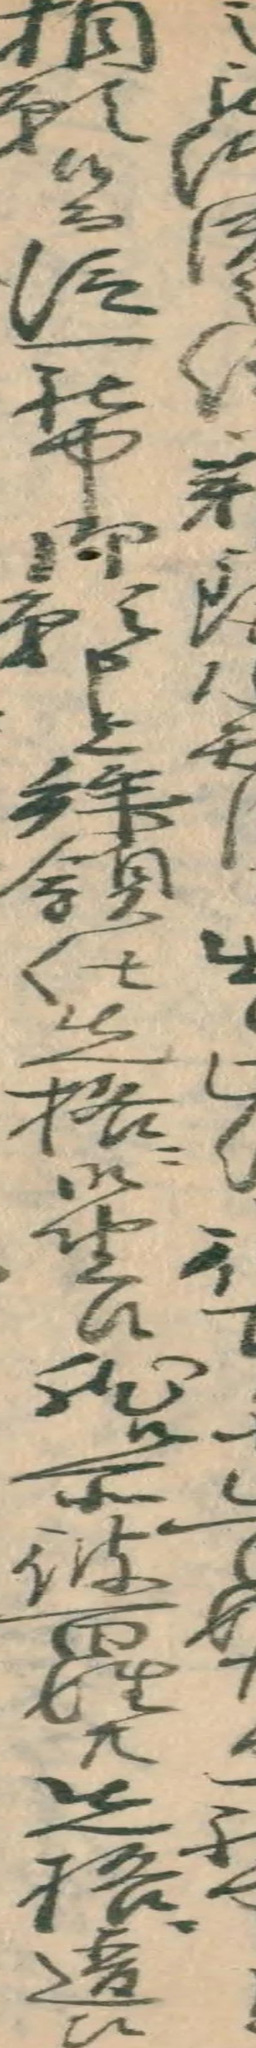相願候而従一社中御願申上拝領仕先格ニ御座候然ル所彼百姓共先格ニ違ひ
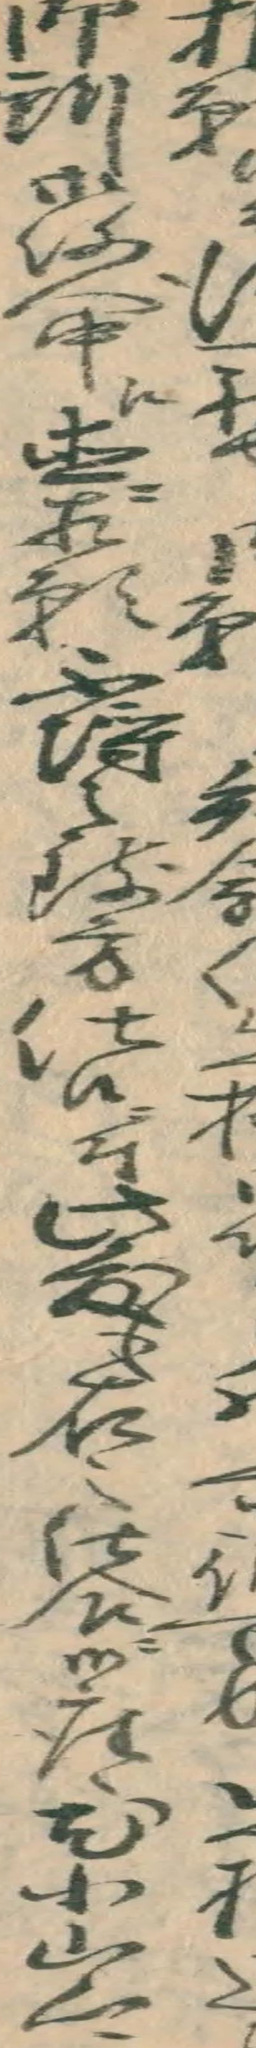御所御役人中江直ニ相願不埒之致方仕候ニ付此度も右之仕合ニ御座候尤小山郷
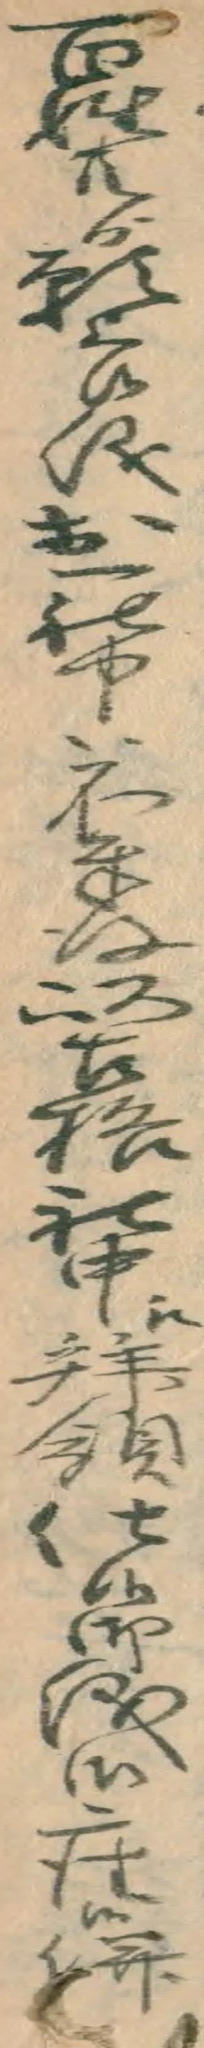百姓共ゟ願上候儀於一社中ハ不奉存以古格社中江拝領仕候御儀御座候

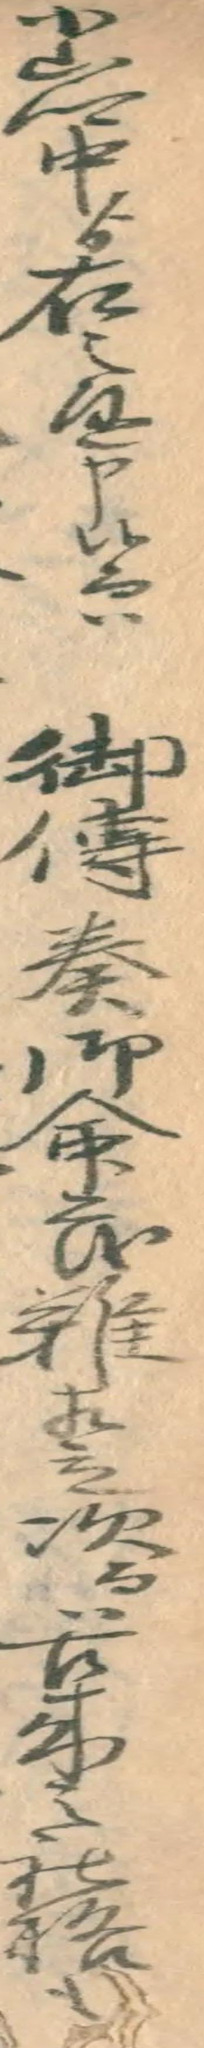小山郷中ゟ右之通申候而ハ御伝奏御命も難相立次而ハ古来之御社格も
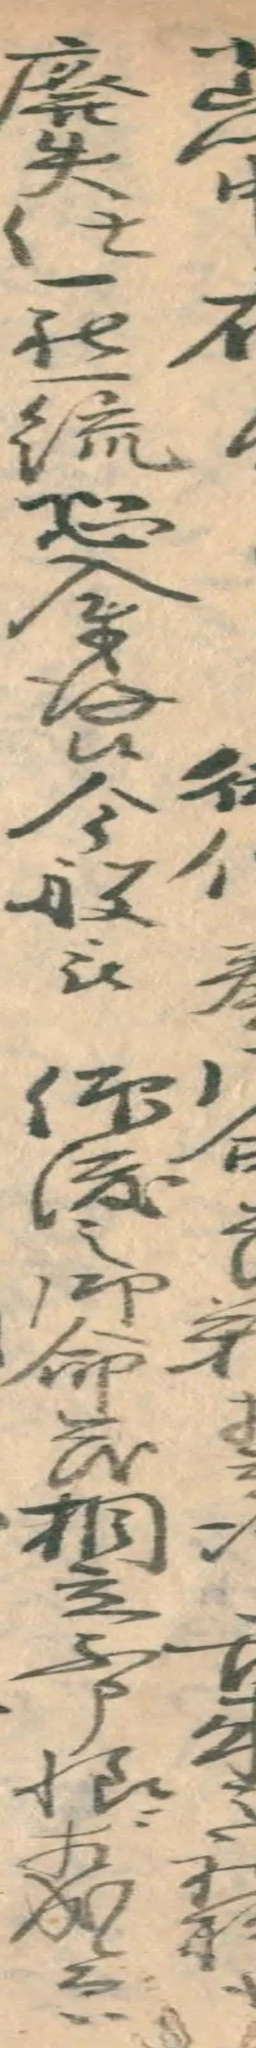廃失仕一社一統恐入奉存候今般被仰渡之御命も相立不申様ニ相成候而ハ
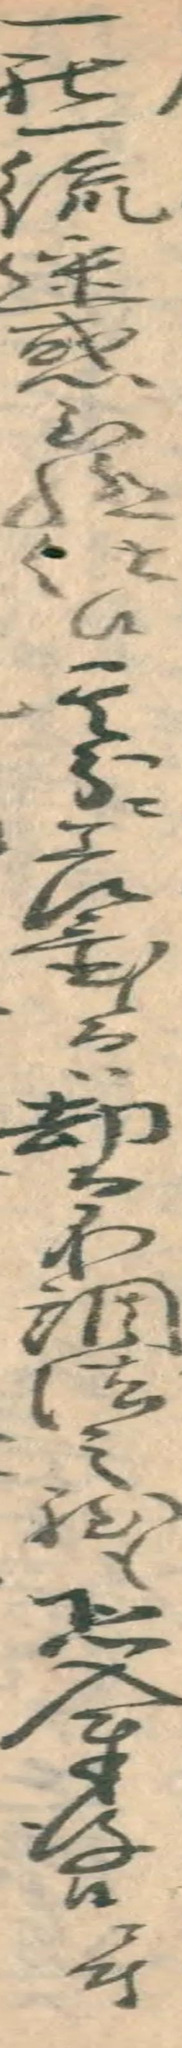一社一統迷惑至極仕候其分ニ差置候而ハ却而不調法之程も恐入奉存候ニ付
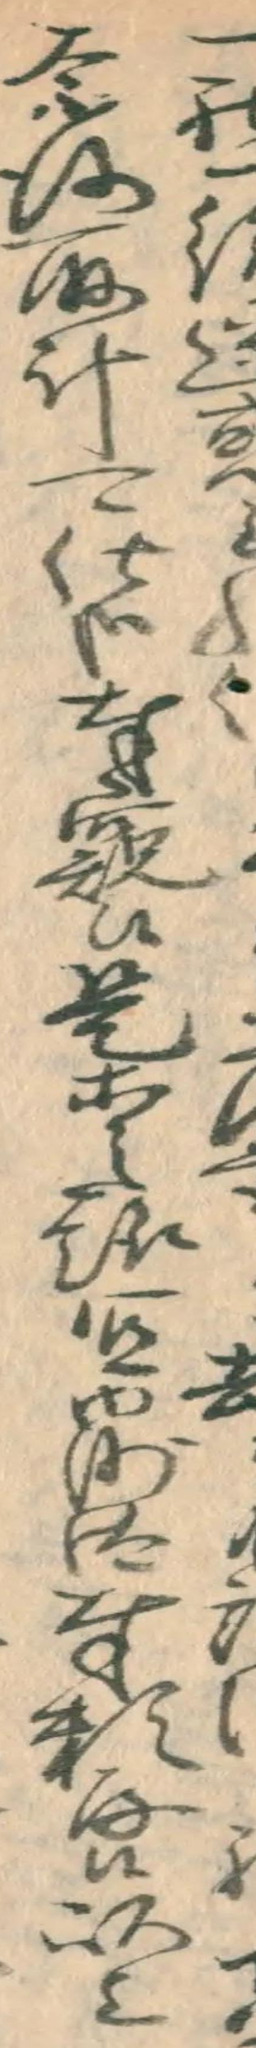奈何取計可仕哉奉窺候是等之趣宜御沙汰奉頼存候以上
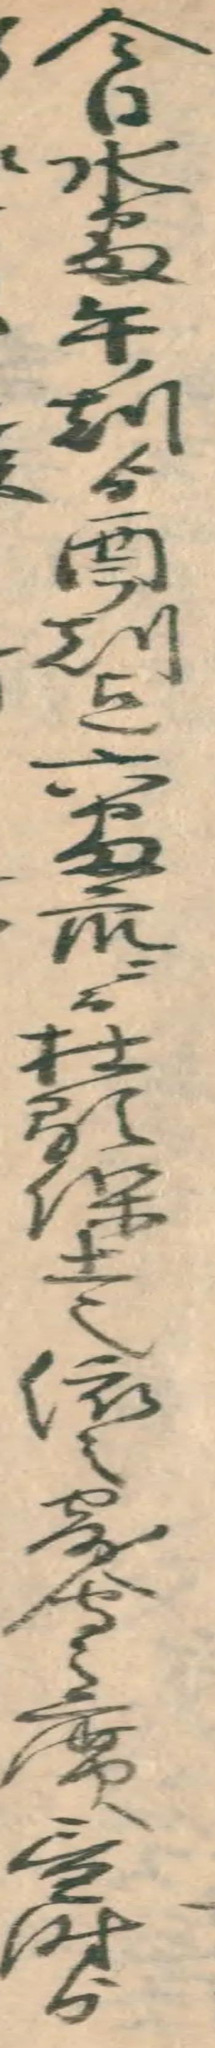一今日水番午ノ刻ゟ酉ノ刻迄六番衆ニ而杜顕保土也依之寄会之席へ昼時ゟ
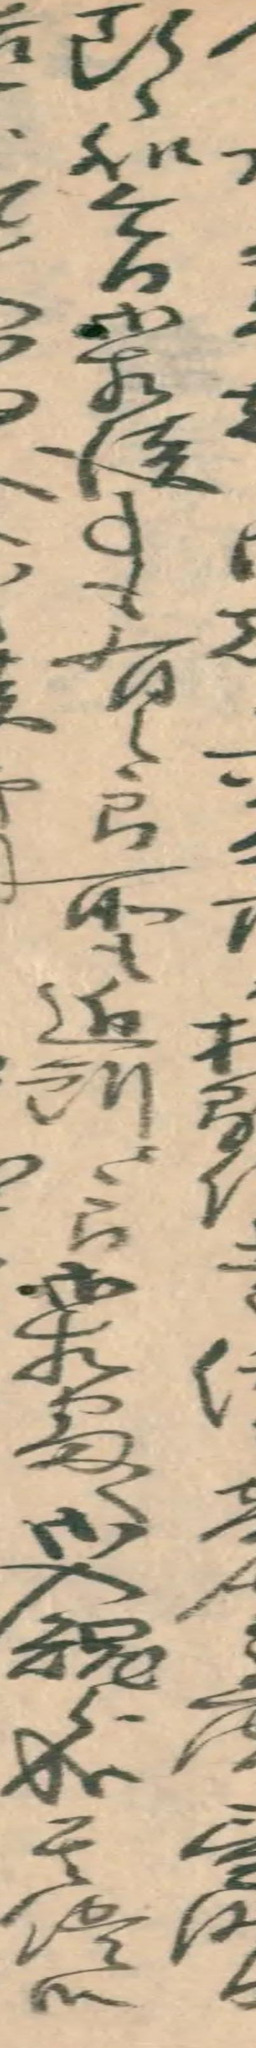断候処今日御相談事も有之候間所も近所ニ候間御相番へ御入魂被成其儘御
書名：賀茂社記録. 第58冊
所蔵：国立国会図書館 National Diet Library, JAPAN
